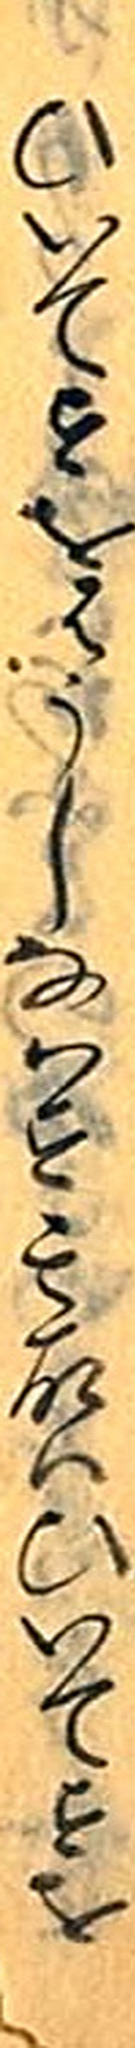ひいてすをはうしなはす其故はひいてすを
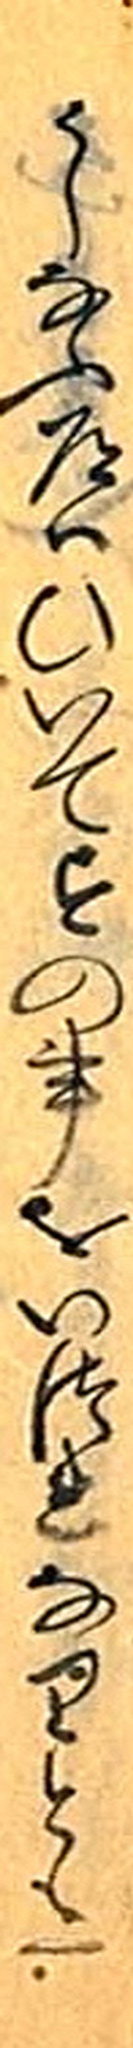うしなふ道はひいてすの事をいつれなりとも
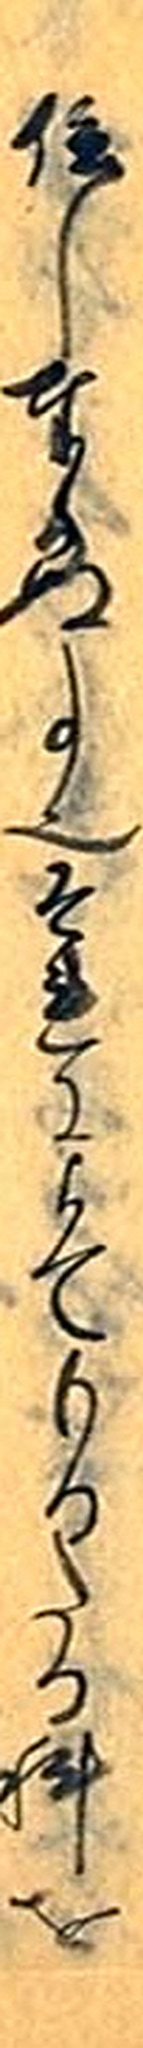信し奉らぬ事也それによてもるたる科を
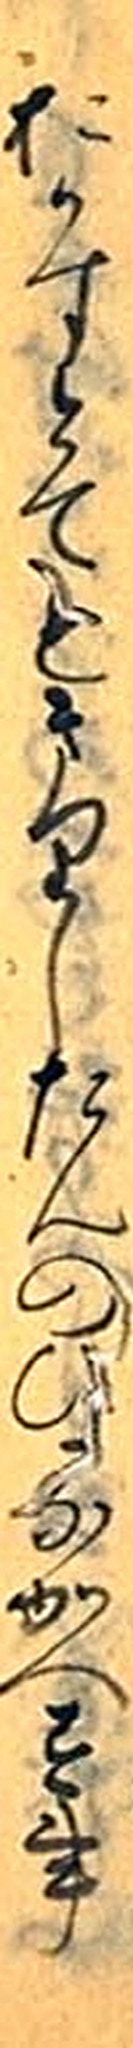おかすとてもきりしたんのひるかへす事
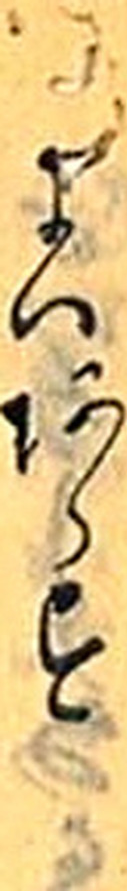にはあらす
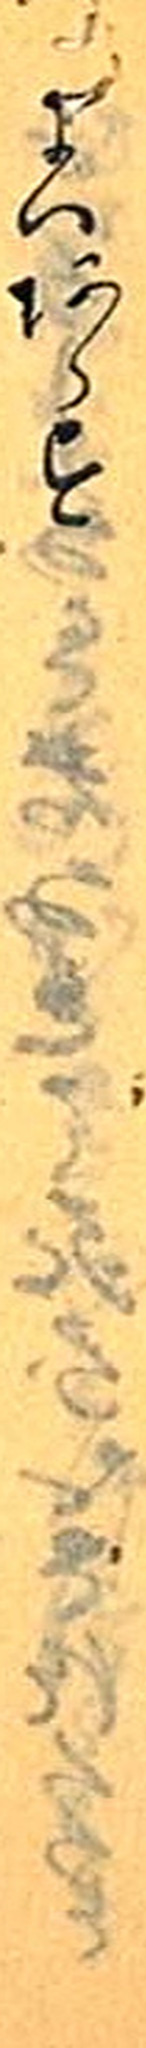にはあらす
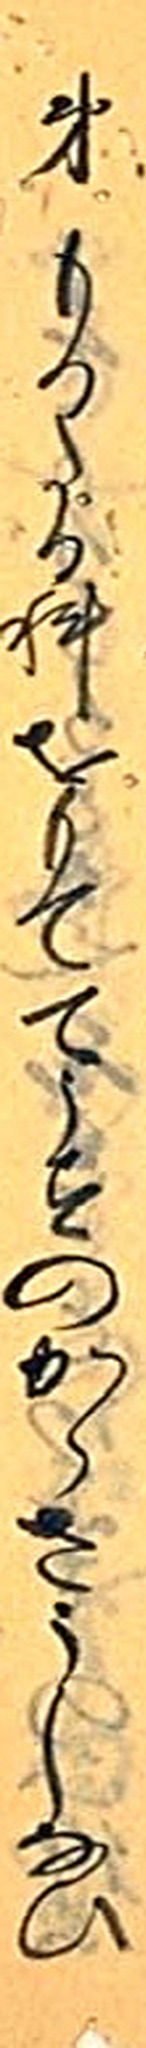弟もるたる科をもててうすのからさうしなひ
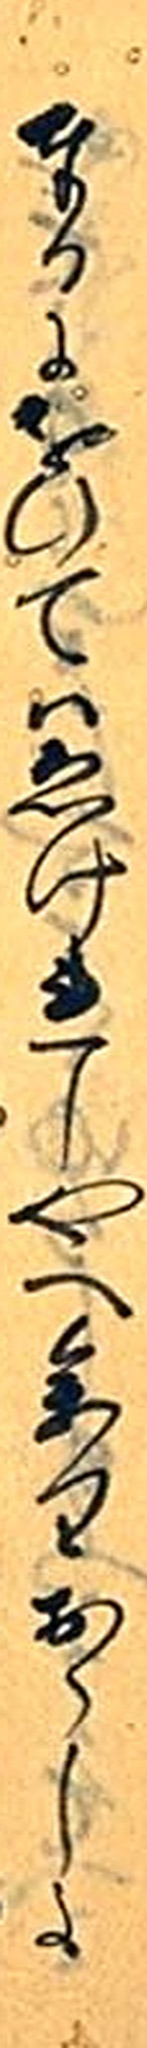奉るにをひてはゑけれしやへ参りおらしよ
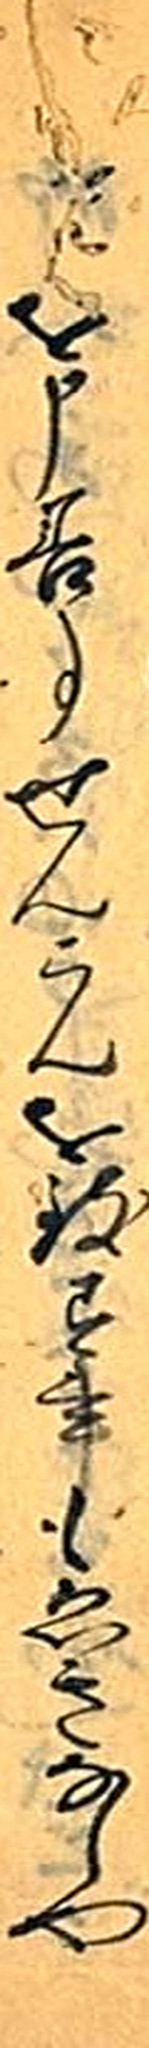を申善事せんこんを致す事もゑきなしや
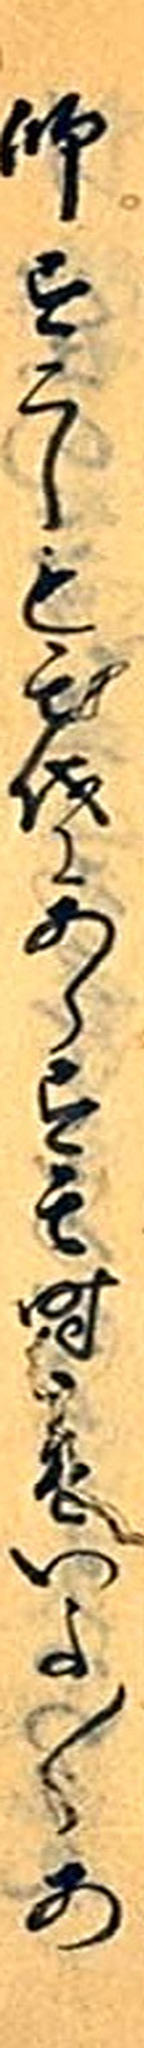師すこしも其儀にあらす其時そいよ〳〵あ
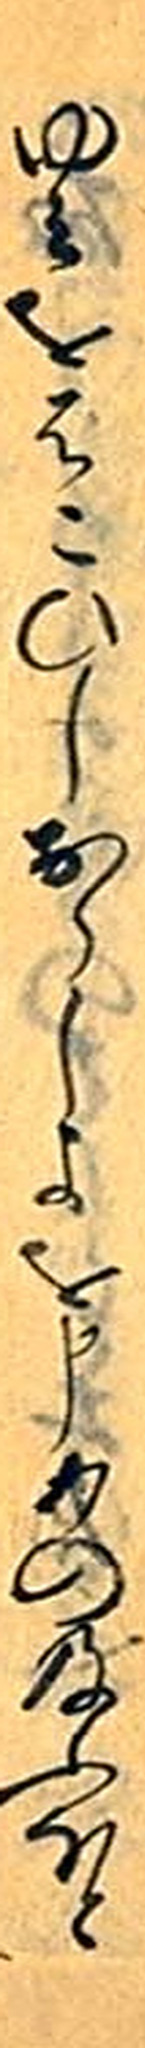ゆみをはこひしおらしよを申力の及ふほと
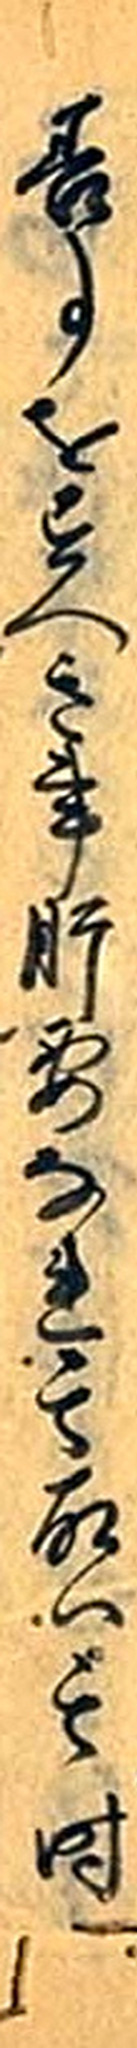善事をすへき事肝要なれ其故は其時
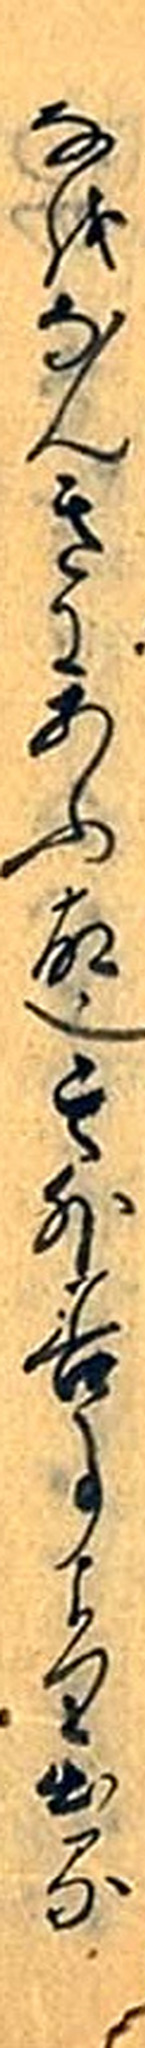なをなんきにあふ故也其外善事より出る
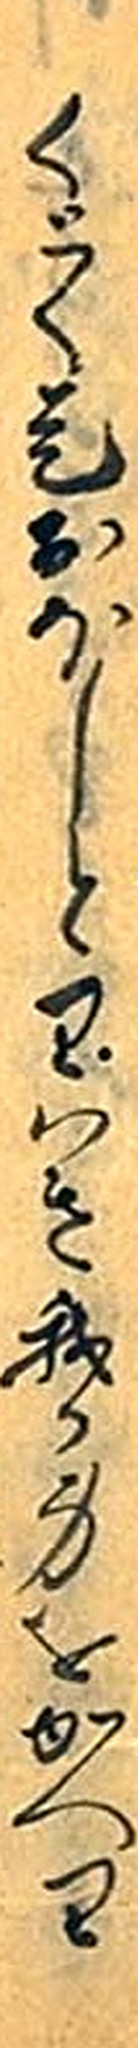くとく是おほしとりはき我か身をかへり
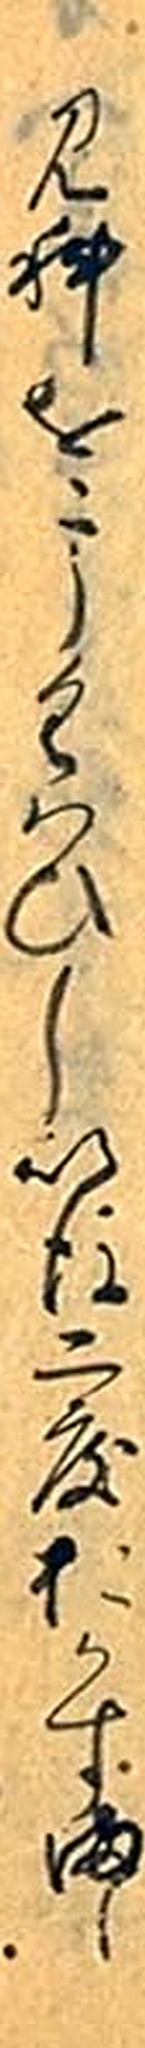見科をこうくはひし以後二度おかすまし
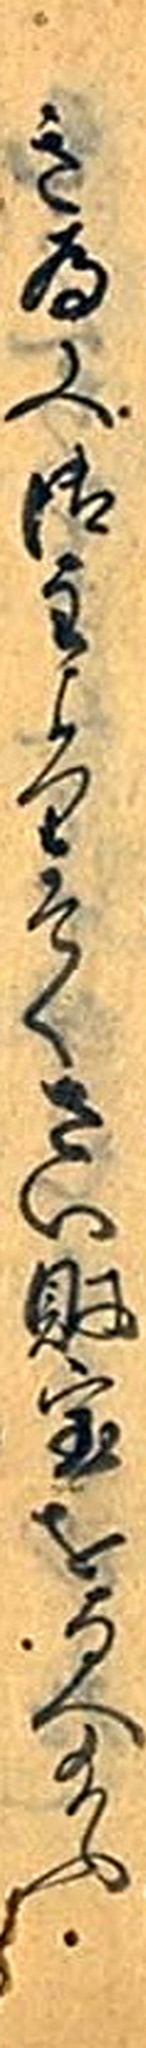き為又御主よりそくさい財宝を与へ給ふ
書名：ドチリナ・キリシタン
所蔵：東京大学総合図書館 / General Library in the University of Tokyo
